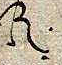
R.
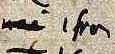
_ 1 fra
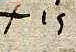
f 15
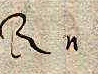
R n
